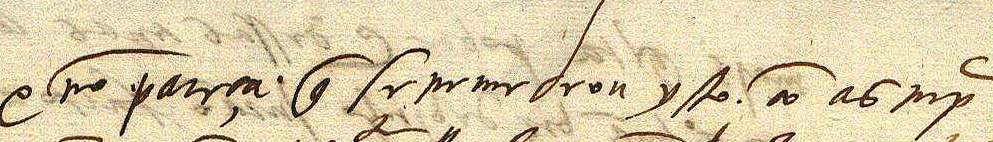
e n̄o pareça. q̄ se remedeou ysto. c̄o as rep̄
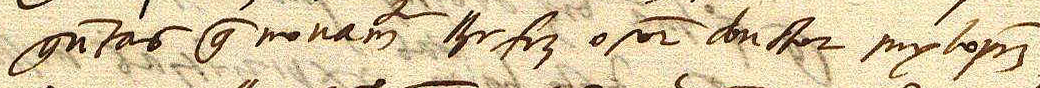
gūtas q̄ nouamte lhe fez o s̄or douctor ruy lopez
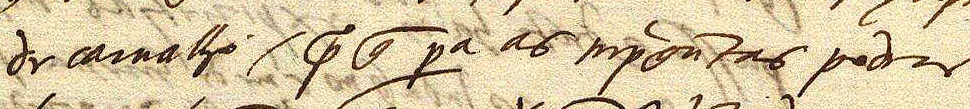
de carualho / p̄oq̄ ꝑa as reꝑgūtas poderē
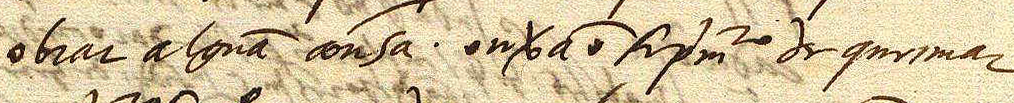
obrar alguā cousa. ouꝟão se pimro de queimar
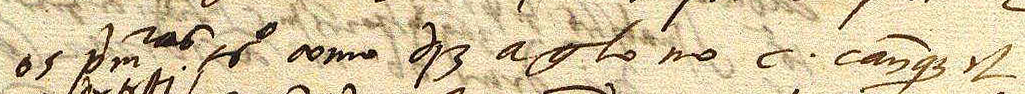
os pimros tso como djz aq̄lo no c. can̄ꝙ el
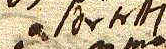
1o de testj
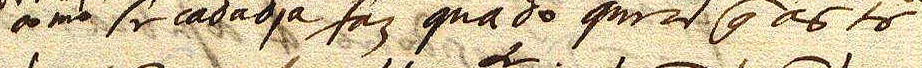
como se cada dja faz quādo querē q̄ as tsa
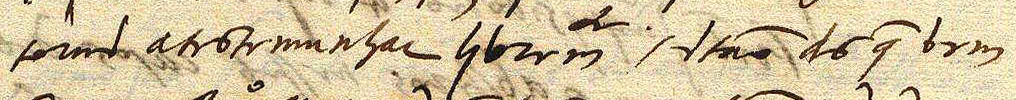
tornē a testemunhar ljvremte / ētão des q̄ vem
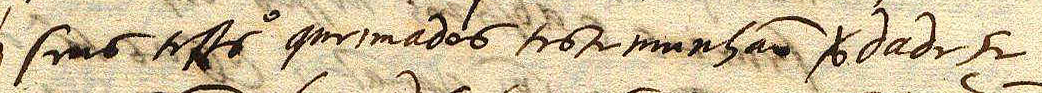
seus testso queimados testemunhão ꝟdade ee
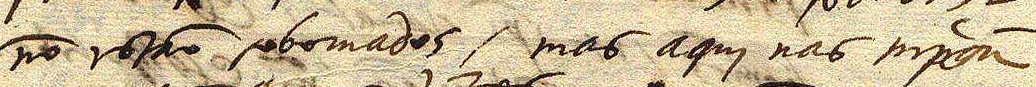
n̄o estão sobornados / mas aquj nas rep̄gū
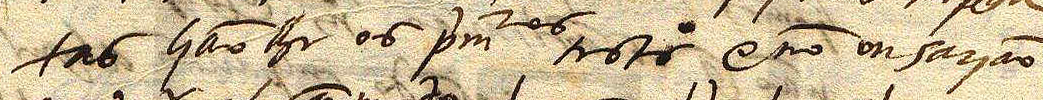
tas ljão lhe os pimros testso e n̄o ousarjão
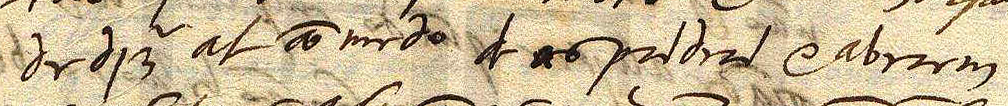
de diz̄ al c̄o medo de os prēderē e averem
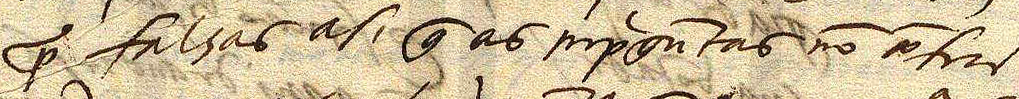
p̄o falsas asi q̄ as rep̄gūtas n̄o c̄oferē
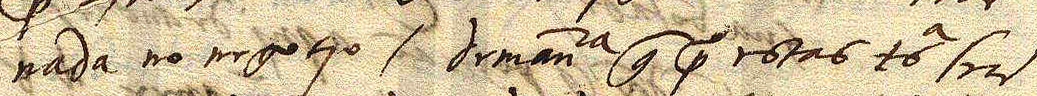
nada no negotjo / de manra q̄ p̄o estas tsa serē
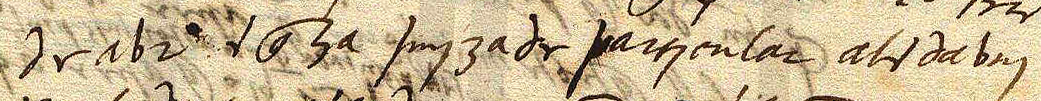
de avro ē q̄ ha Jmjzade partjcular alē da vnj
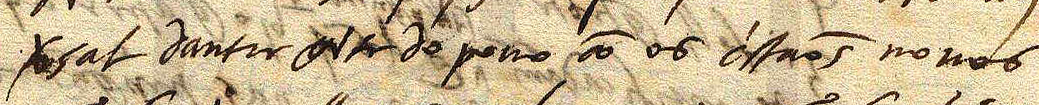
ꝟsal dantre gēte do pouo cō os cistãos nouos
